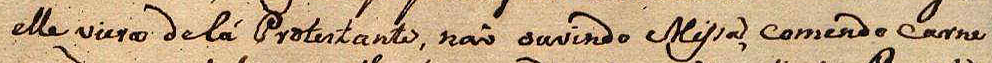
elle viera de lá Protestante, naõ ouvindo Missa, comendo carne
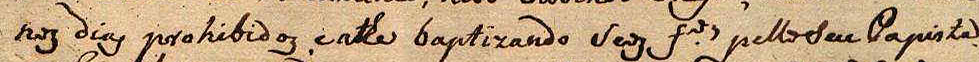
nos dias prohibidos, e athe baptizando seos f.os pello seu Papista
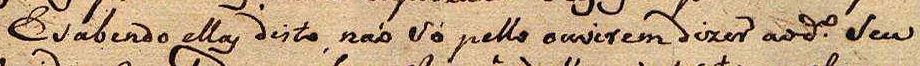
E sabendo ellas disto, naõ só pello ouvirem dizer ao d.o seu
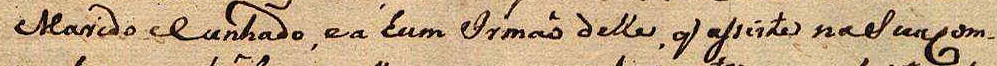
Marido e Cunhado, e a hum Irmaõ delle, q̄ assiste na Sua Com
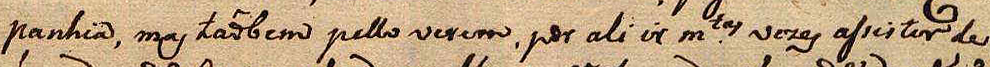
panhia, mas taõbem pello verem, por ali ir m.tas vezes assistir de
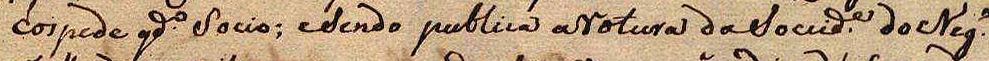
hospede qd.o Socio; e sendo publica a Rotura da Soceid.e do Neg.o
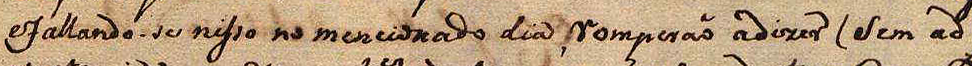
e fallando-se nisso no mencionado dia, romperaõ a dizer (sem ad
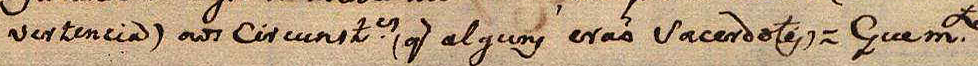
vertencia) aos Circunst.es (q̄ alguns eraõ sacerdotes) = Que m.to
